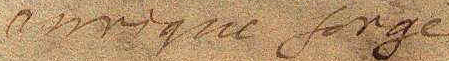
anrique Jorge
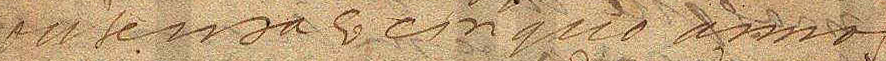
outenta & cinquo annos
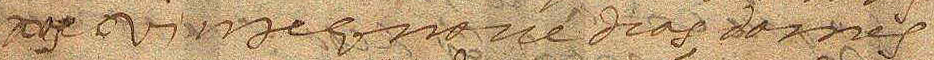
aos vinte & noue dias do mes
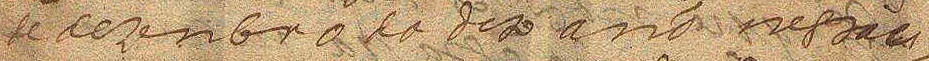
de dezenbro do dito anō nesta ci
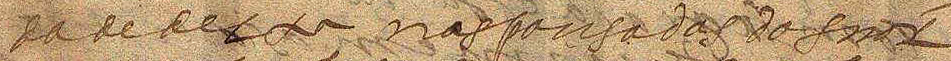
dade de Lxa nas pousadas do snor̄
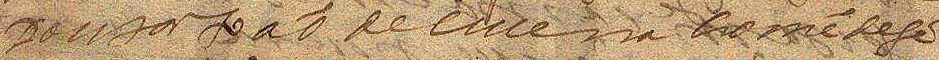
Doutor Joaõ de lucena homē desē
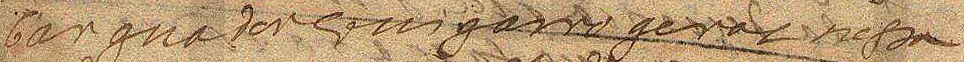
barguador & uigairo geral nesta
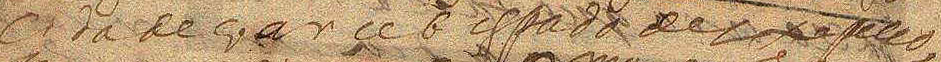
cidade & arcebispado de Lxa pello
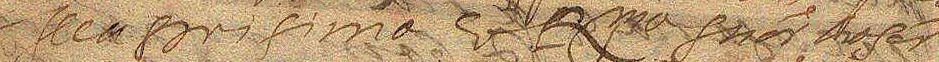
Jllustrisimo & Exmo snor̄ ho sor̄
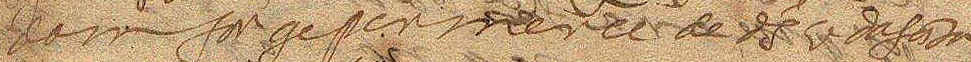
dom Jorge per merce de ds̄ & da sāta
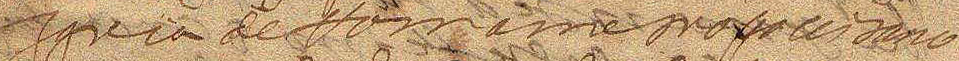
Jgreia de Roma metropollitano
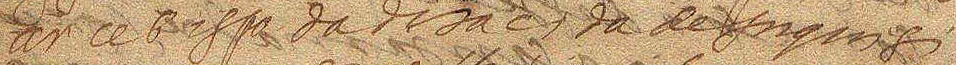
arcebispo da dita cidade Jnquisi
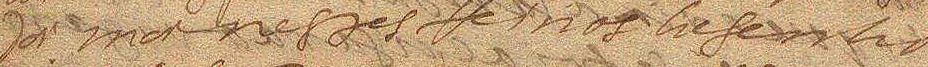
dor mor nestes Reinos he senho
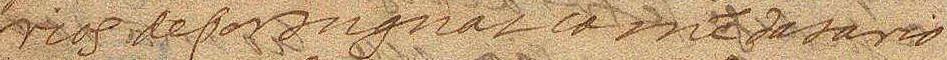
rios de portugual comēdatario
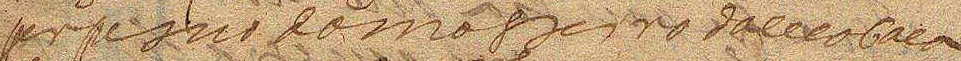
perpetuo do mosteiro dallcobaca
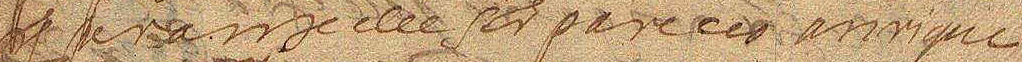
c̄ꝭ perante elle sor̄ pareceo anrique
